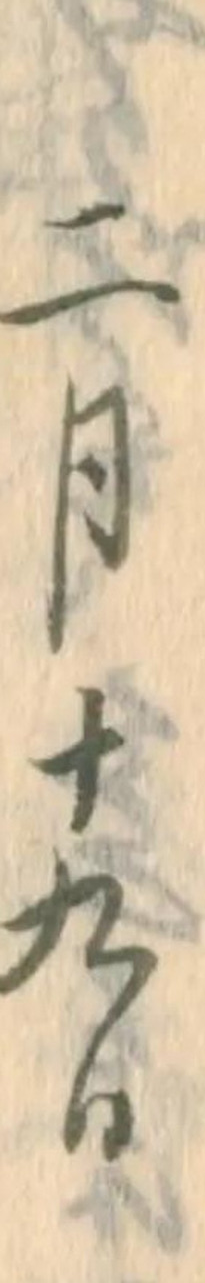二月十九日
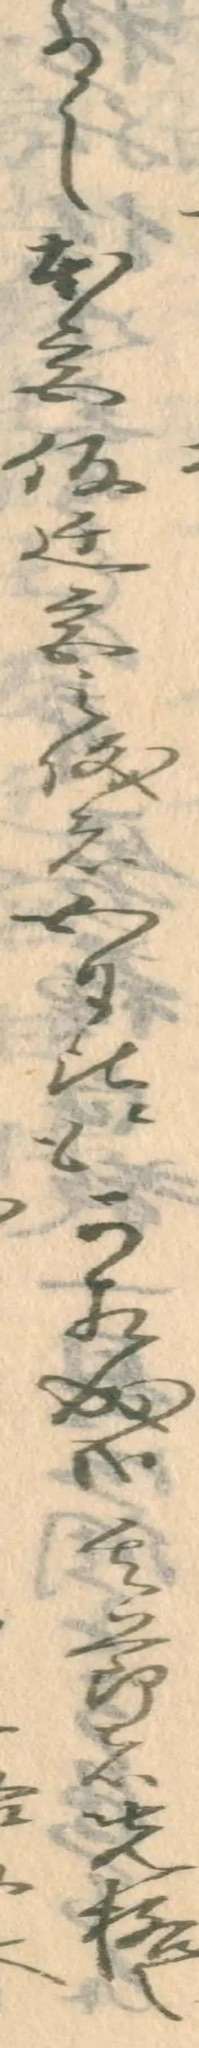候へく本宮仮迁宮之儀は五月比ニも可相成哉其節者先格之
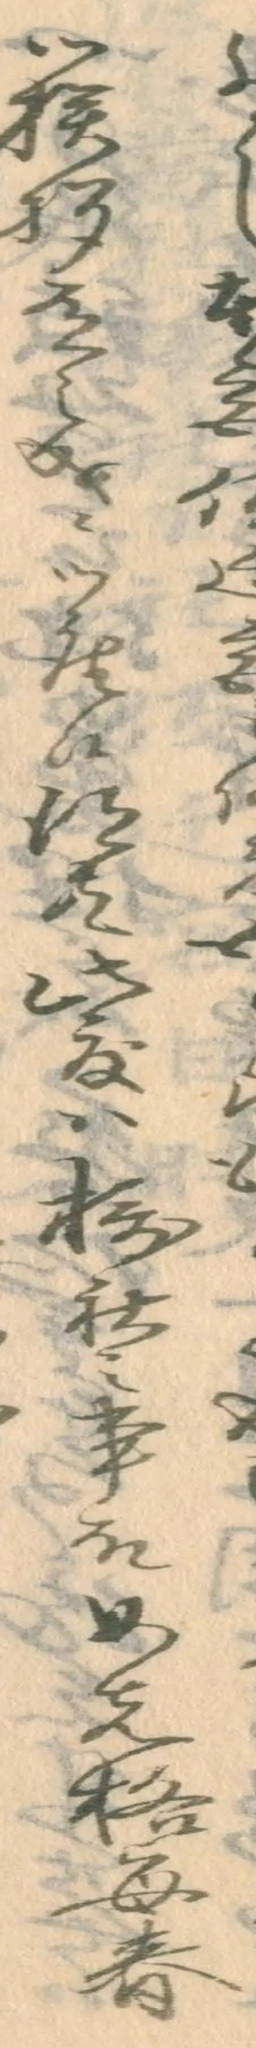御挨拶有之哉ニ御座候得共此度ハ摂社之事故如先格毎春
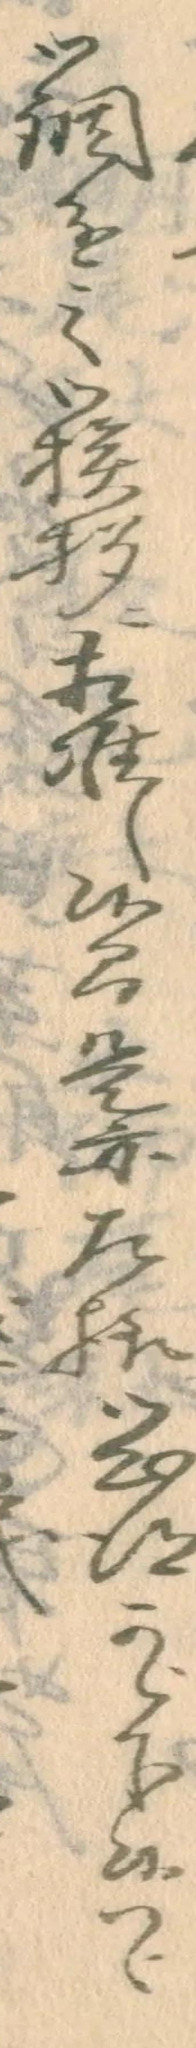御調進之御挨拶ニ相准し候間是亦左様御心得可被下候以上
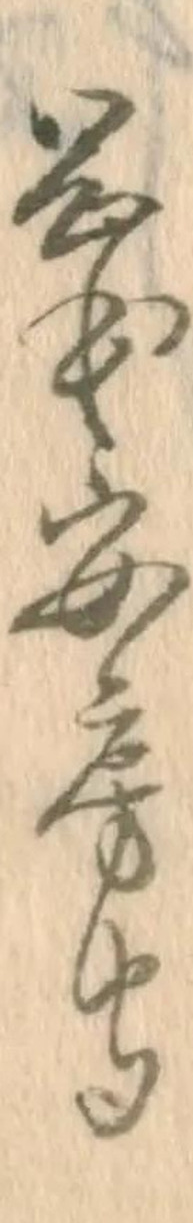岡本安房守
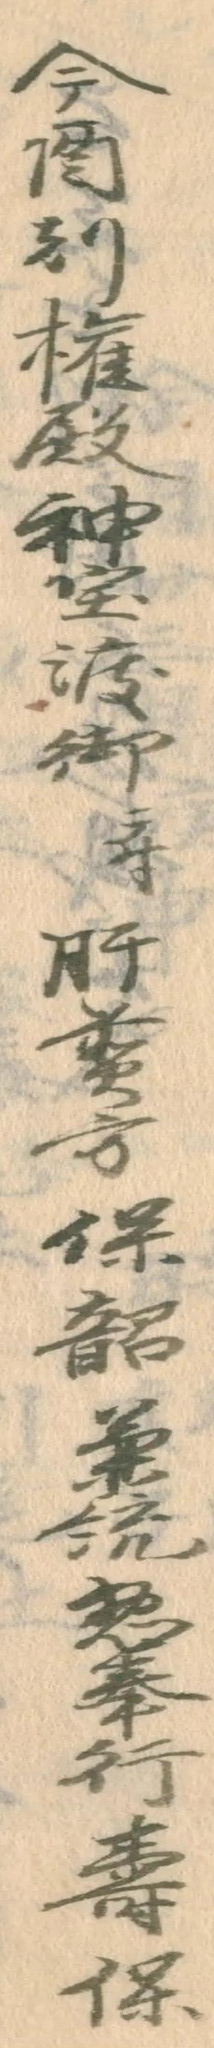一今酉刻権殿神宝渡御ニ付肝煎方保韶兼統惣奉行寿保
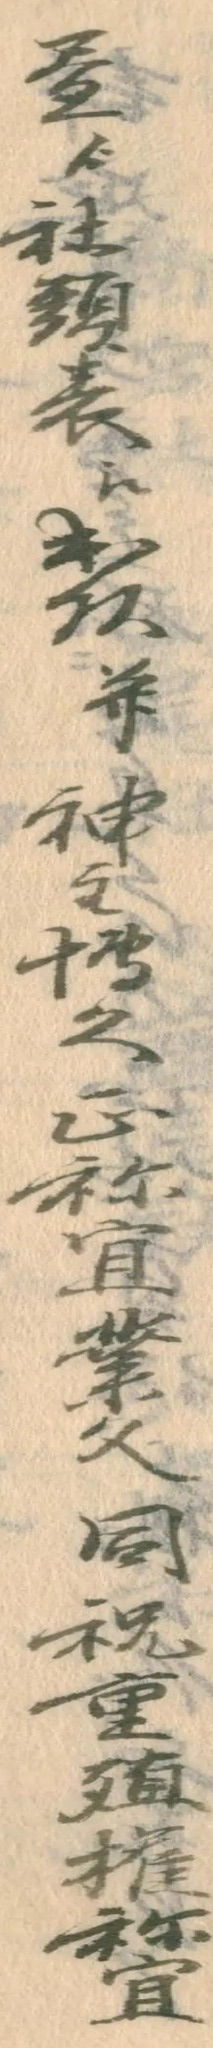昼ゟ社頭表江出頭并神主博久正祢宜業久同祝重殖権祢宜
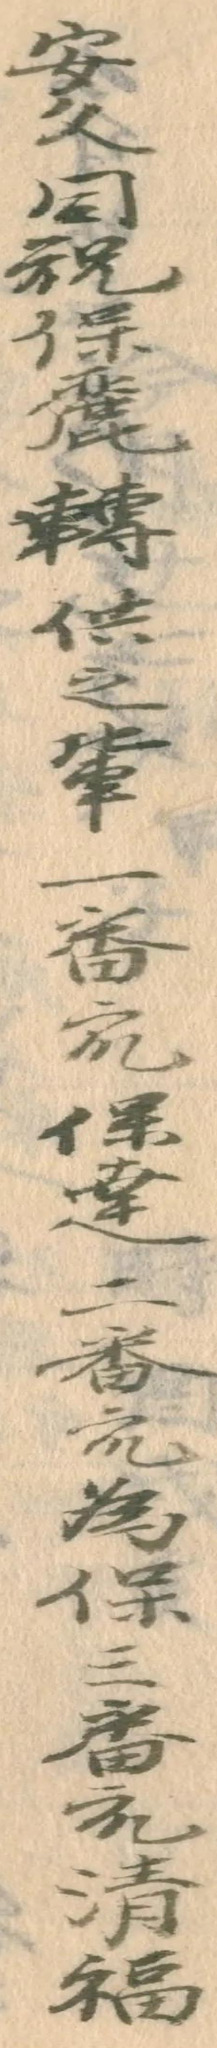安久同祝保麗転供之輩一番衆保達二番衆為保三番衆清福
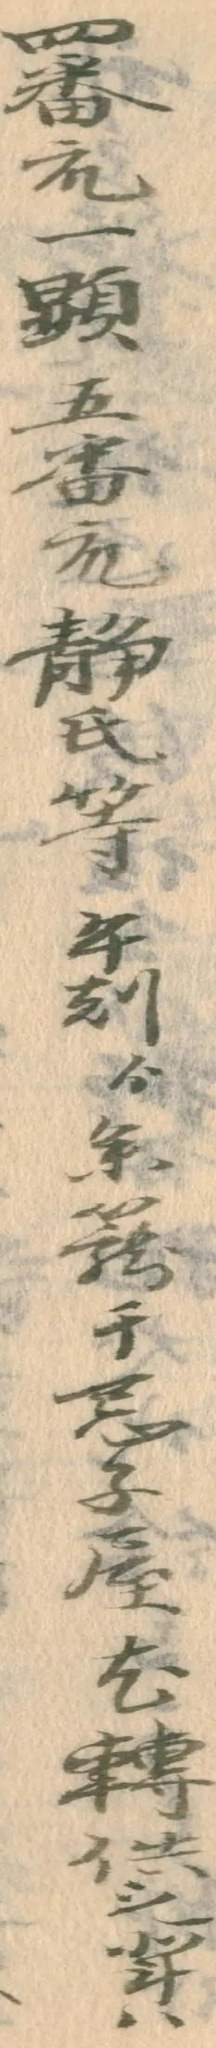四番衆一顕五番衆静氏等午刻ゟ参籠于忘子屋尤転供之輩ハ
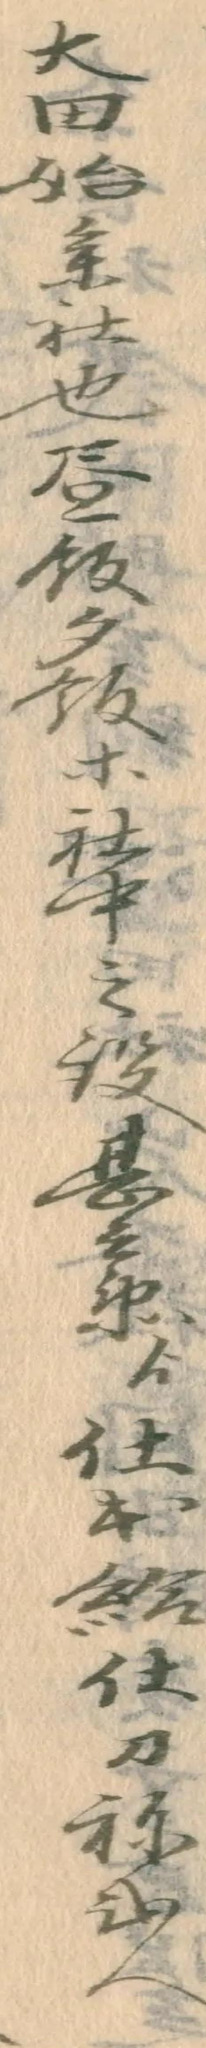大田始参社也昼飯夕飯等社中之役甚兵衛ゟ仕本給仕刀祢弐人
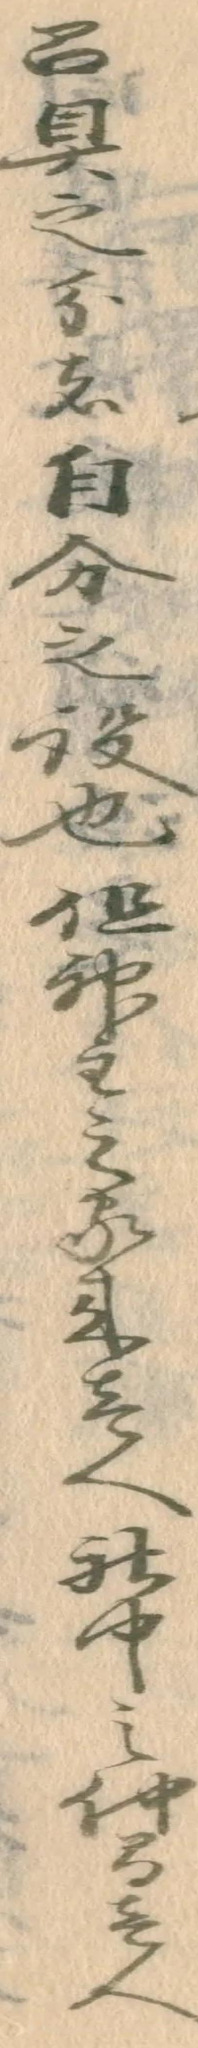召具之分は自分之役也但神主之家来壱人社中之仲間壱人
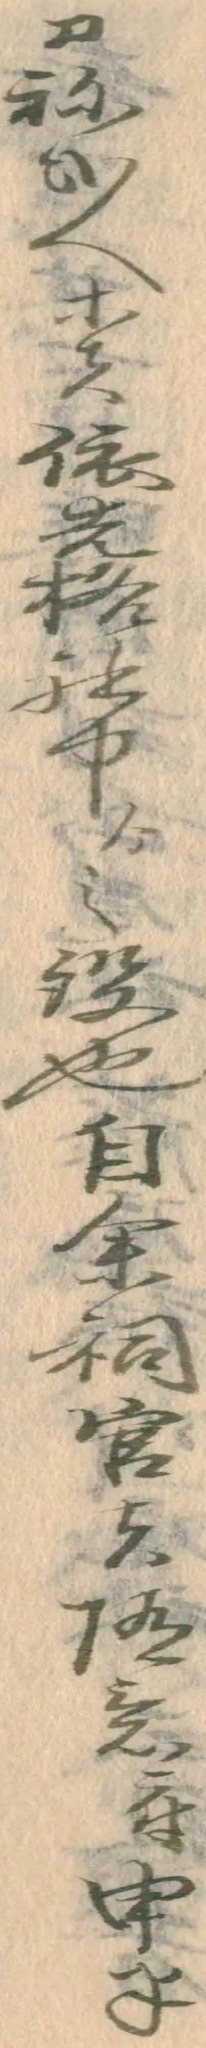刀祢弐人等は依先格社中ゟ之役也自余祠宮は随意ニ付申半
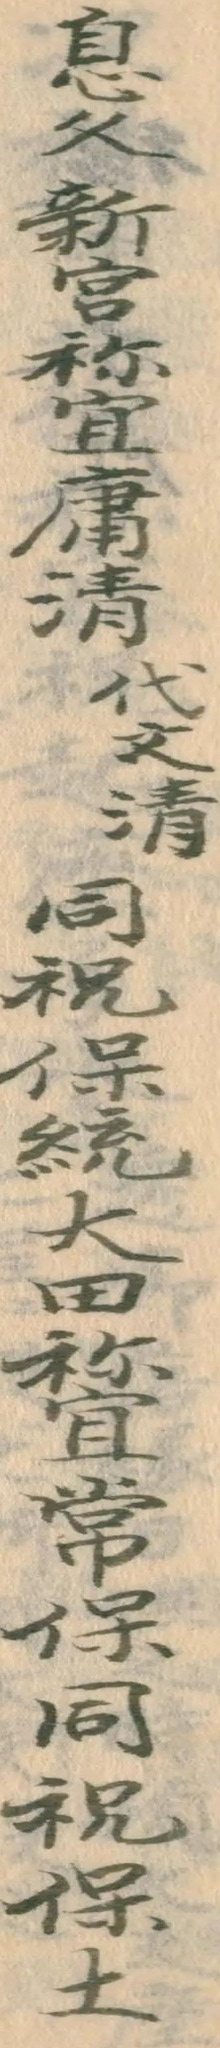息久新宮祢宜庸清代文清同祝保統大田祢宜常保同祝保土
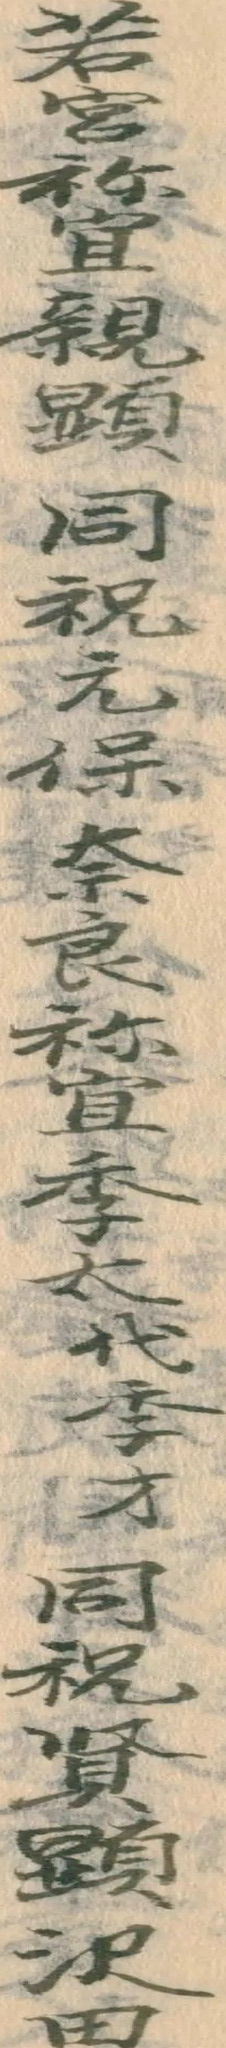若宮祢宜親顕同祝元保奈良祢宜季太代季才同祝賢顕沢田
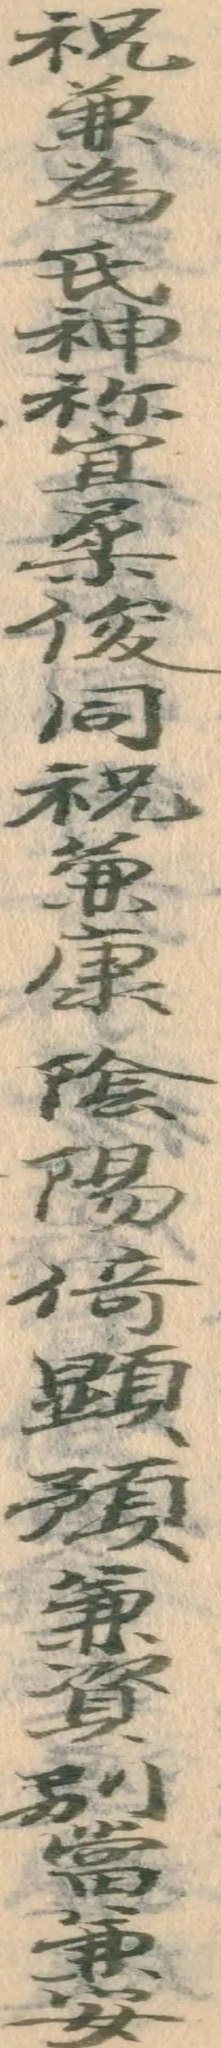祝兼為氏神祢宜柔俊同祝兼康陰陽倚顕預兼資別当兼安
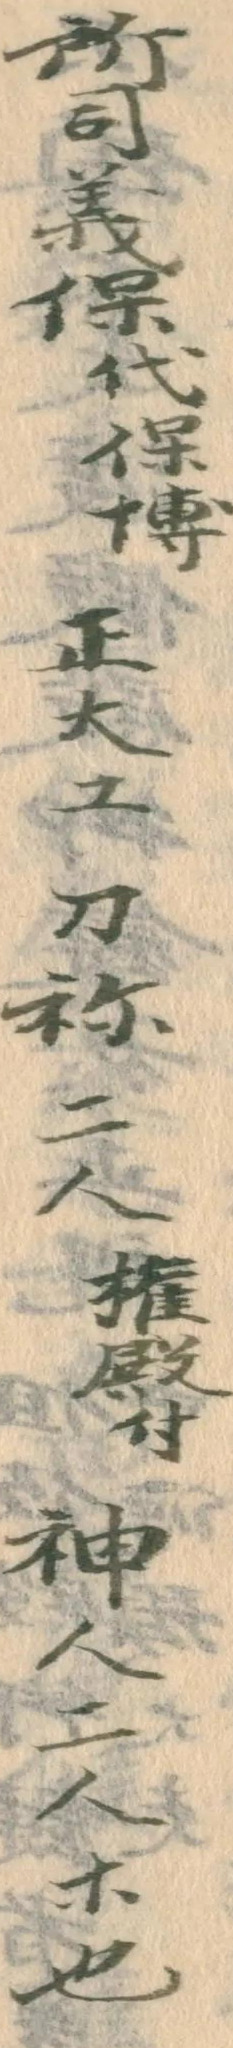所司義保代保博正大工刀祢二人権殿付神人二人等也
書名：賀茂社記録. 第17冊
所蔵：国立国会図書館 National Diet Library, JAPAN
